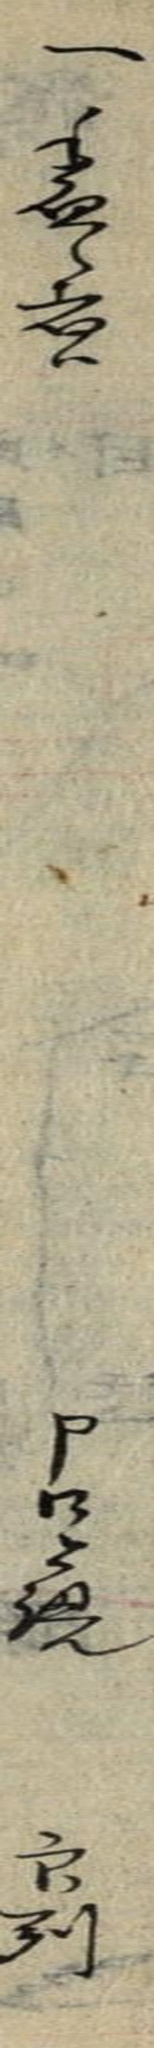一手負之者は申口と認ル印判
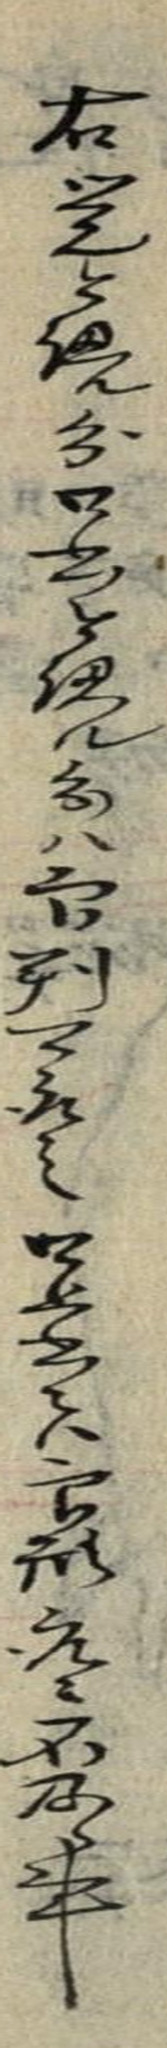右覚と認ル分口書と認ル分は印判可取之口上書には印形取に不及候事
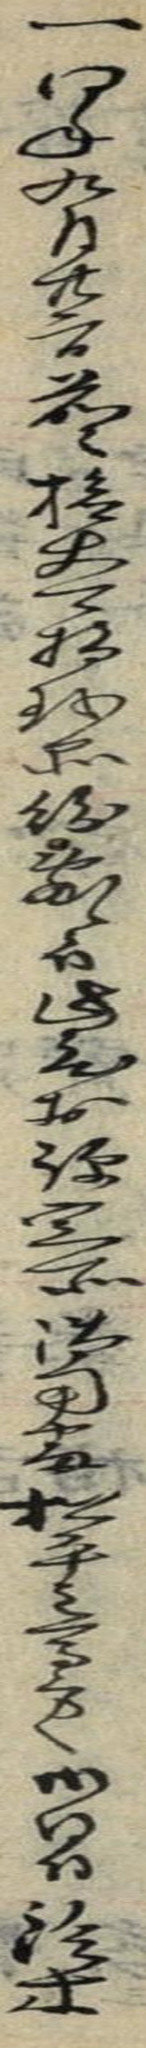一同年九月廿二日前々検使可指越品紛敷候に付此度於評定所御用番松平主馬方へ御目付鈴木
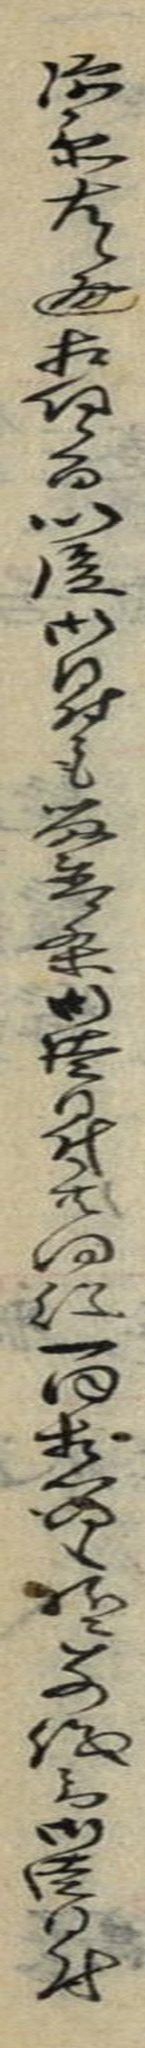源兵衛左之通相伺候間以後御目付にも留置候条御徒目付共同役一同相心得候様にとの儀にて御徒目付
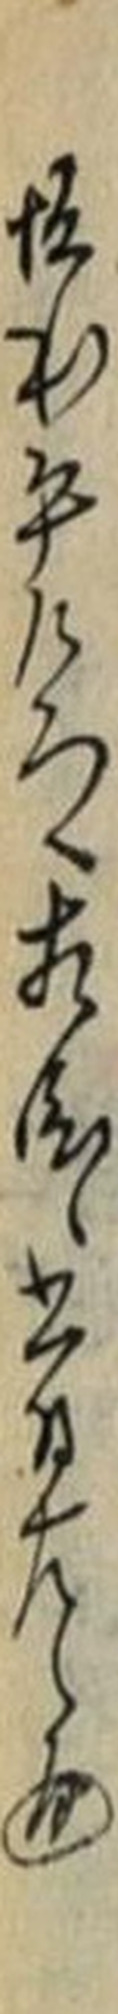坂本平左衛門へ相渡候書付左之通
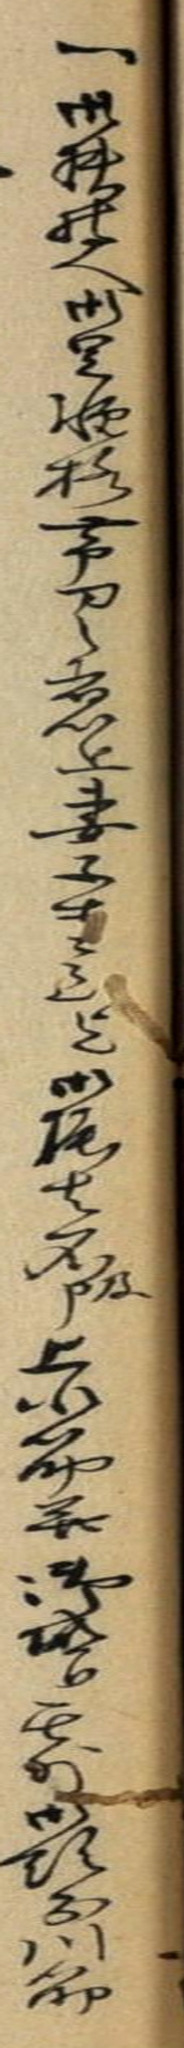一御扶持人御足軽格帯刀之者以上妻子等に至迄御堀は不及申上水筋并御城下其外御領分川筋
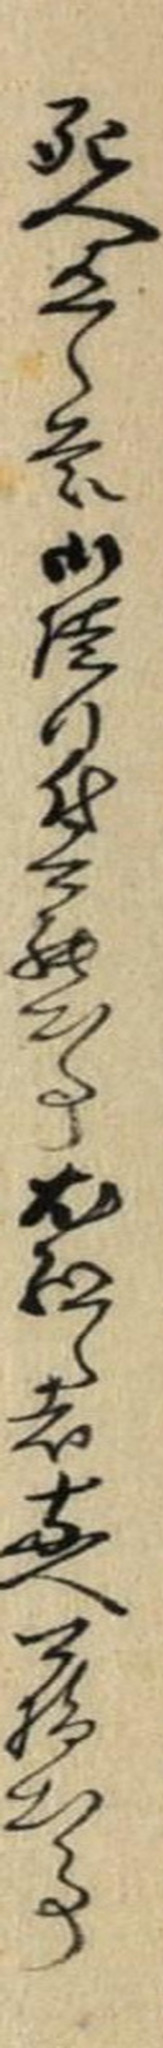死人有之節御徒目付可罷出事尤組之者両人可指出事
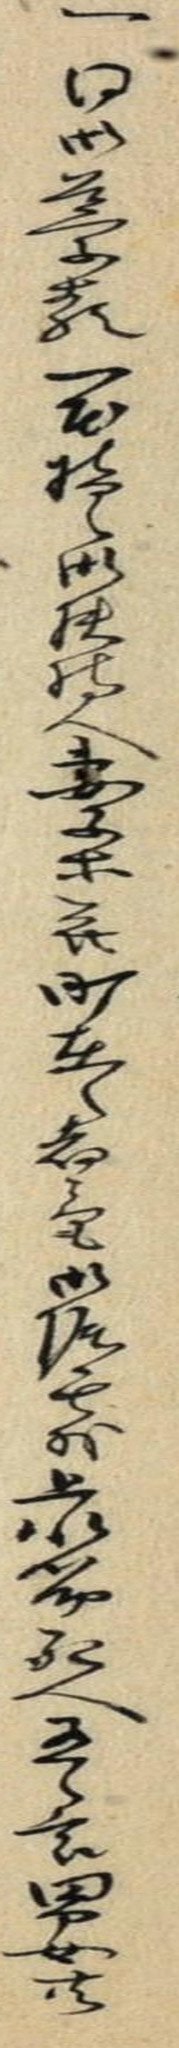一同御荒子類一本指之御扶持人妻子等并町在之者にても御堀其外上水筋死人有之節男女共
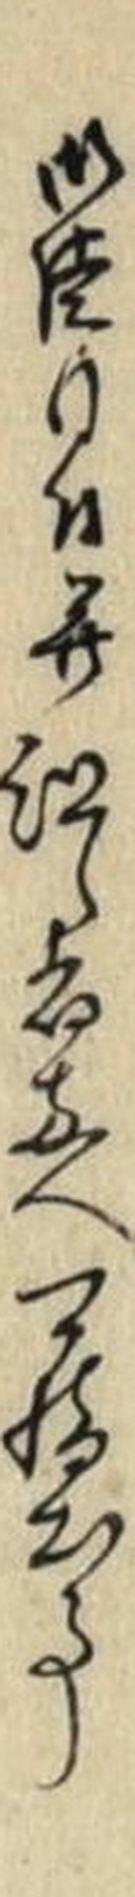御徒目付并組之者両人可指出事
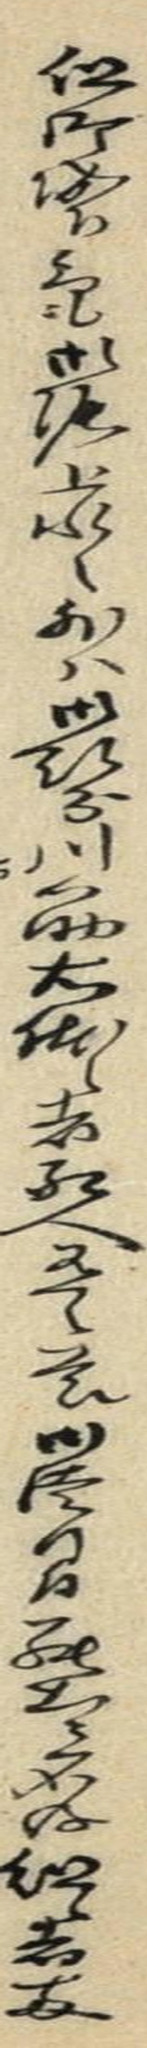但御城下にても御堀上水之外は御領分川筋右体之者死人有之節御徒目付罷出に不及組之者両
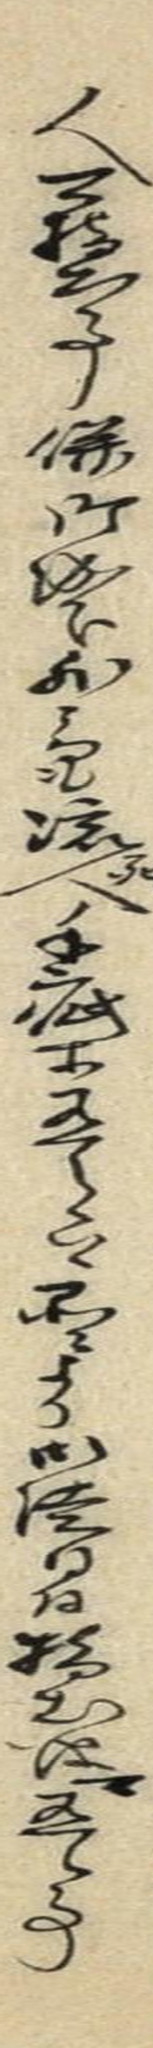人可指出事併御城下外にても流人手疵等有之候はゝ品により御徒目付指出儀可有之事
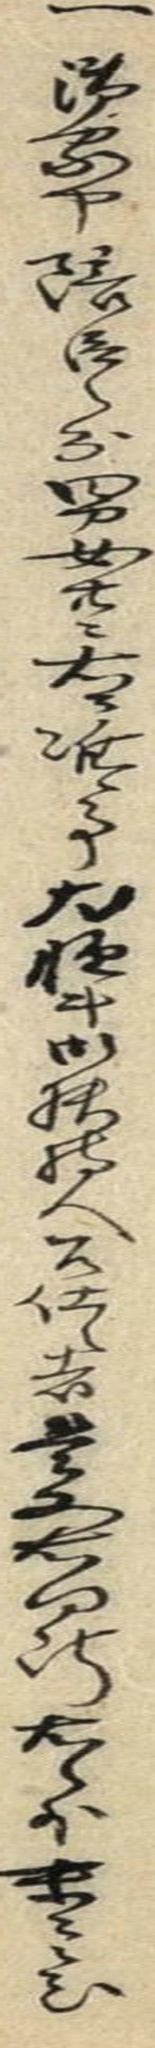一御家中陪臣之分男女共に右に准候事尤軽キ御扶持人召仕之者是又右同断右之外末々に至
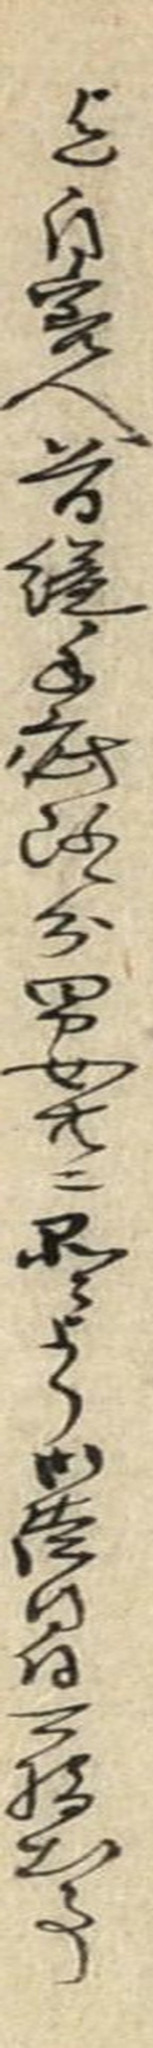迄自害人首縊手疵改候分男女共に品により御徒目付可指出事
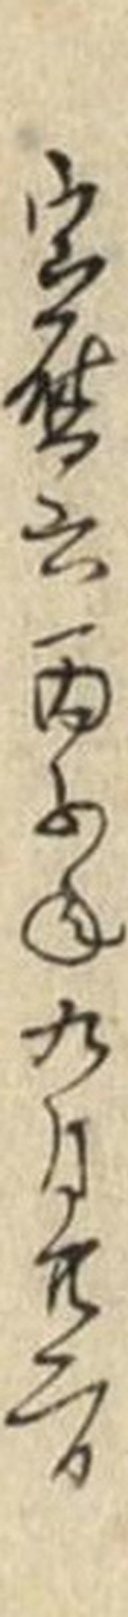宝暦六丙子年九月廿二日
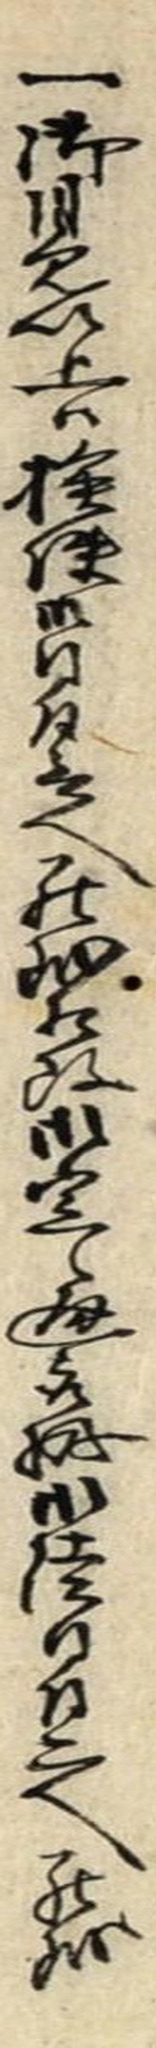一御目見以上は検使御目付壱人罷越相改御定之通取扱御徒目付二人罷越
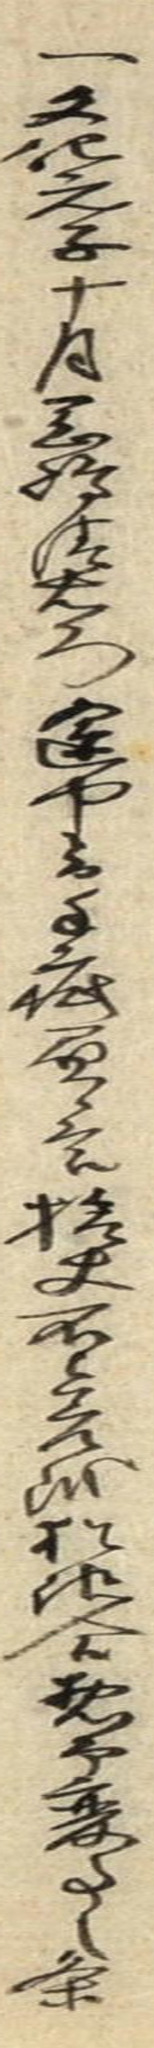一文化元子十月岡島清右衛門途中にて手疵負候節検使不被差越猶訳合惣て変事之条
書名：御停止異変死失
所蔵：福井県文書館 Fukui Prefectural Archives
